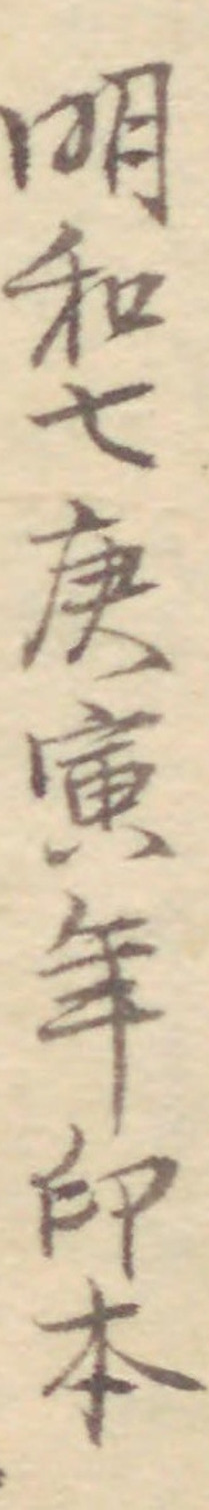明和七庚寅年印本
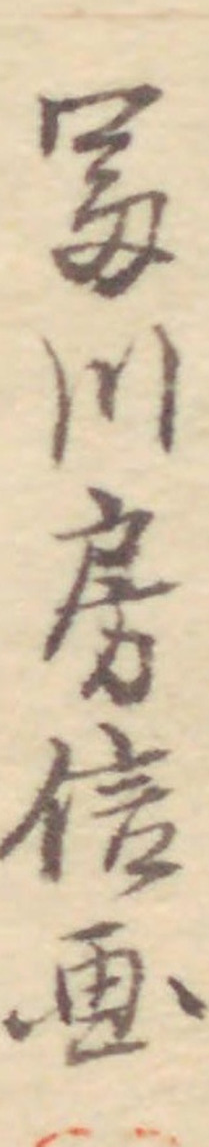富川房信画

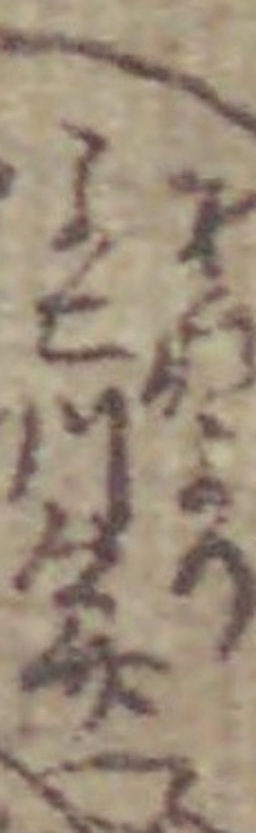よこ川郷介
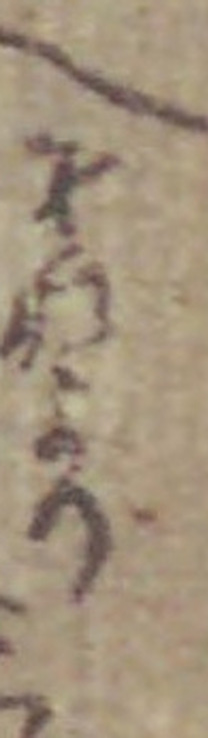それより
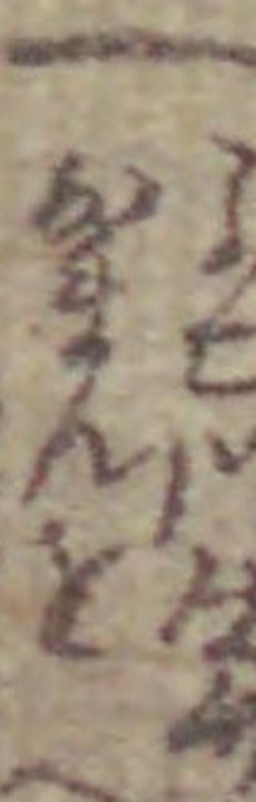おまんを
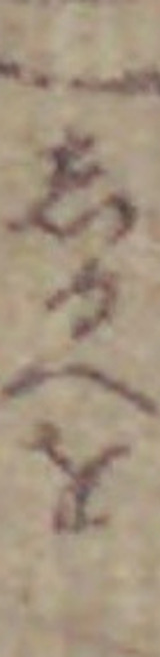しるへを
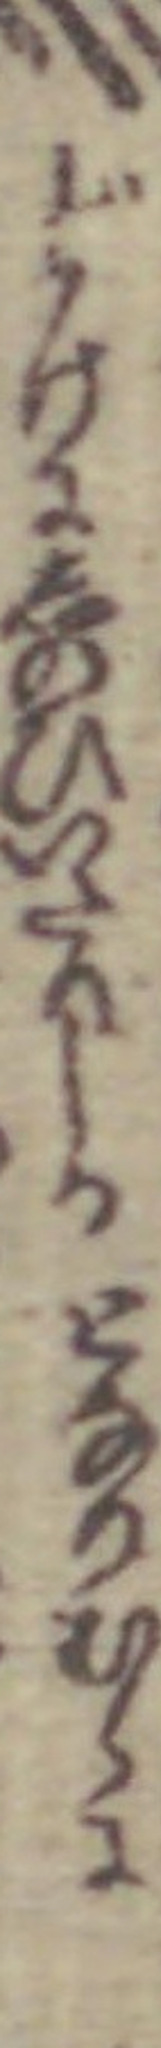どかけにしのひいたりしかとなりむらに
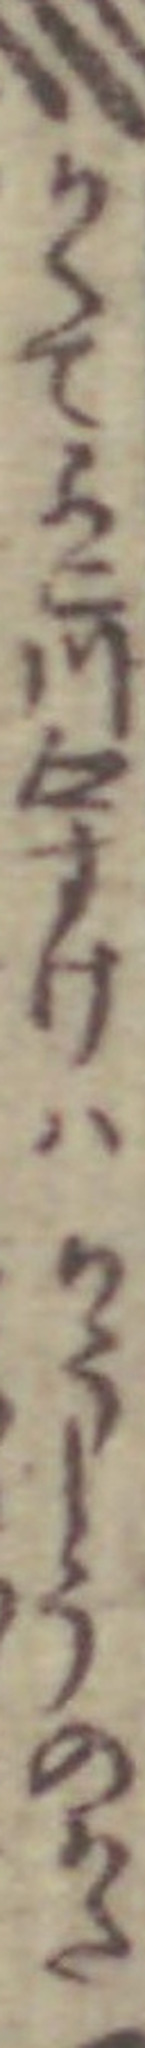かくてよこ川郷すけはかうしうのかた
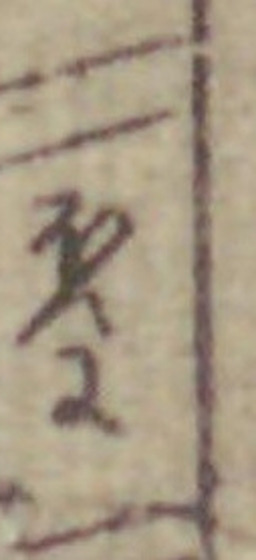ほんに
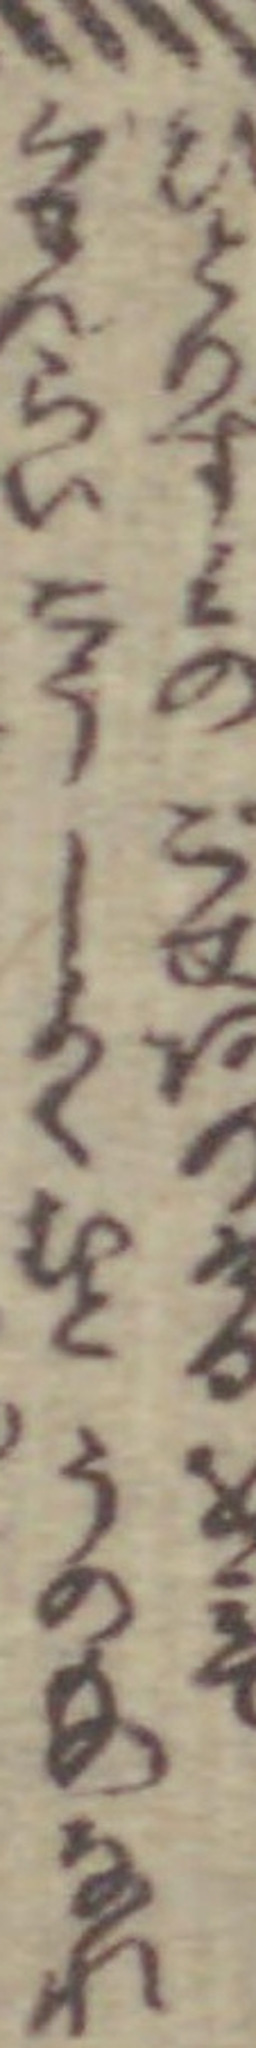くわんらいこうしよくむとうのものなれば
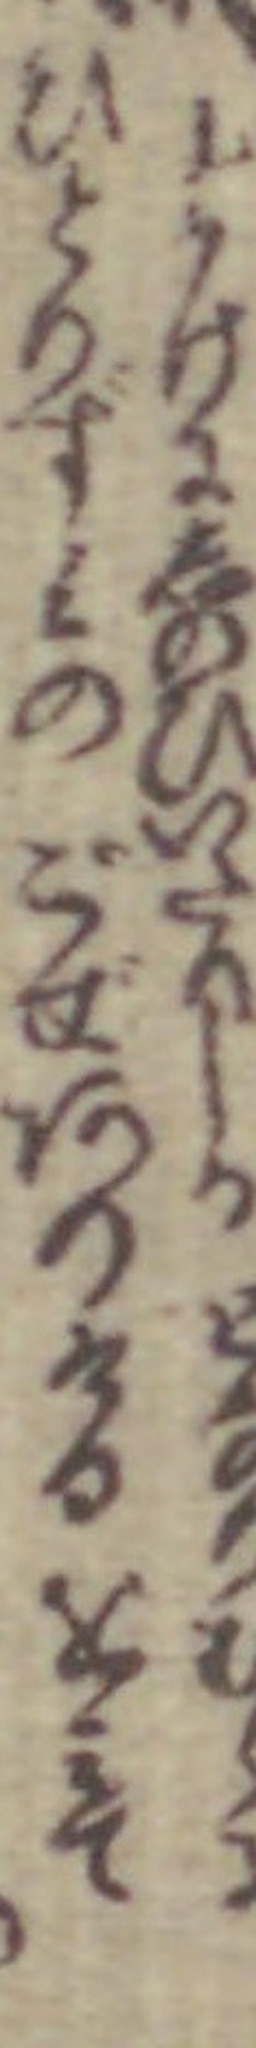ひとりずみのごぜありけるをみて
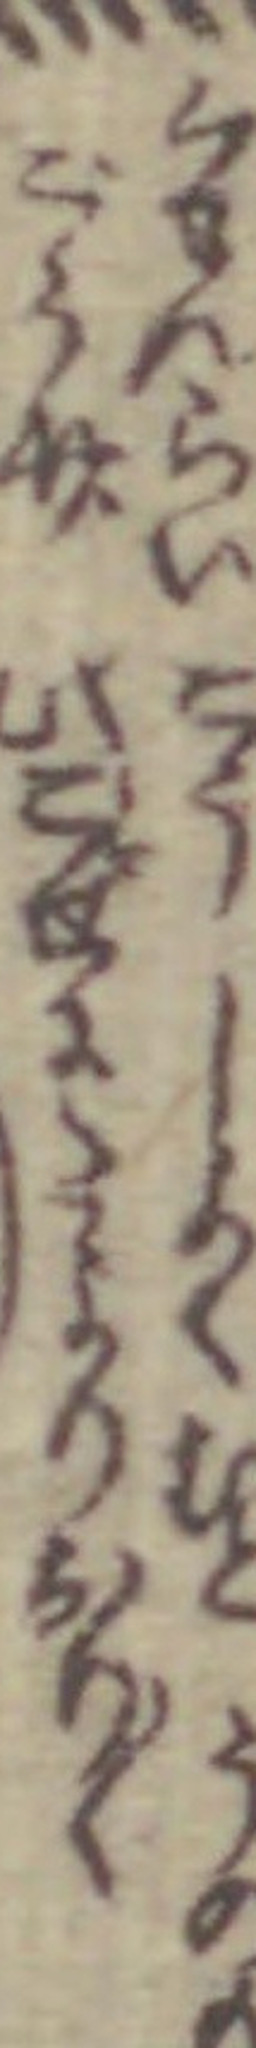ごう介此ごぜにたよりおり〳〵
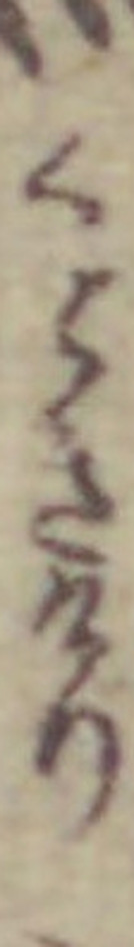くちきけり
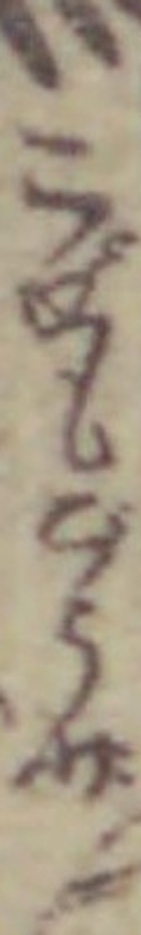こぜもごう介
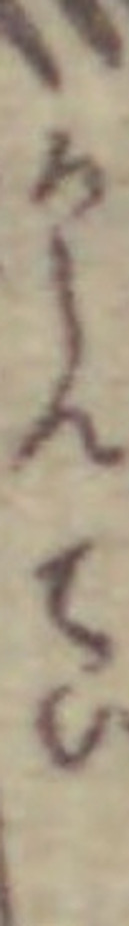かしんてい
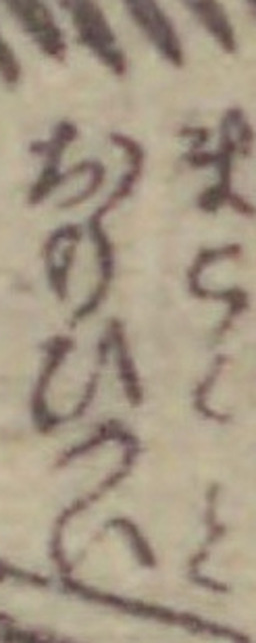おもひつい
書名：化物一家髭女 2巻
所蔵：国立国会図書館 National Diet Library, JAPAN
